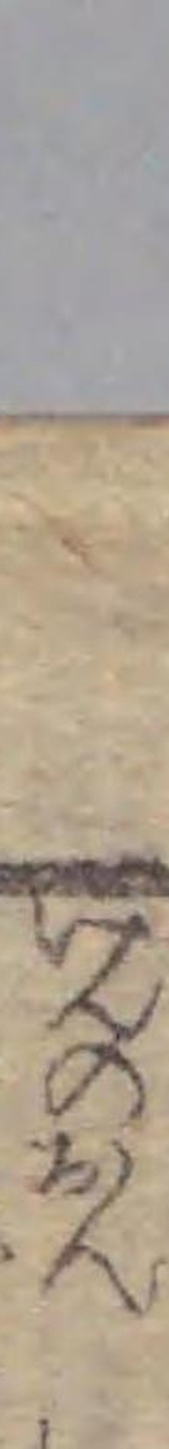けんのおん
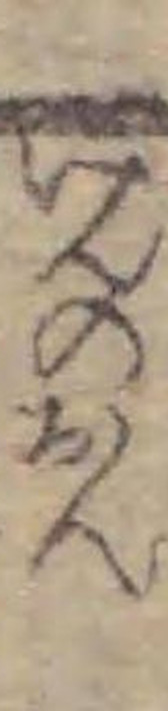けんのおん
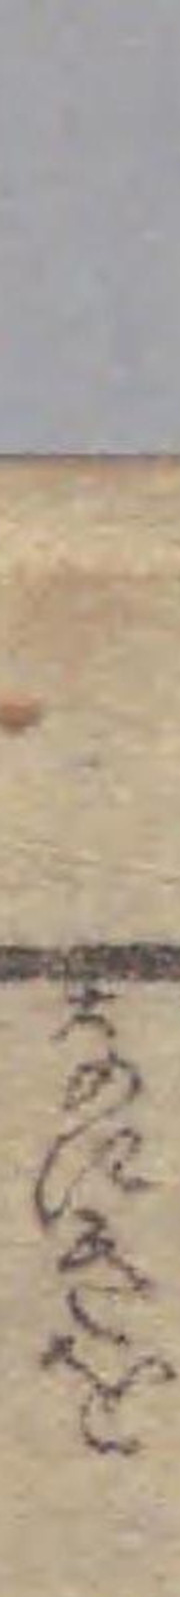なにきを
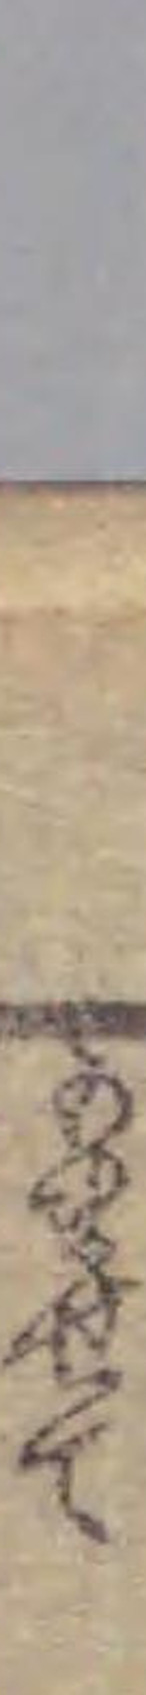もませて
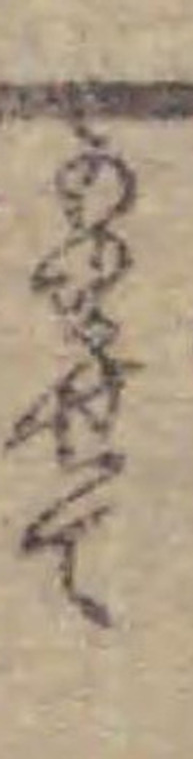もませて
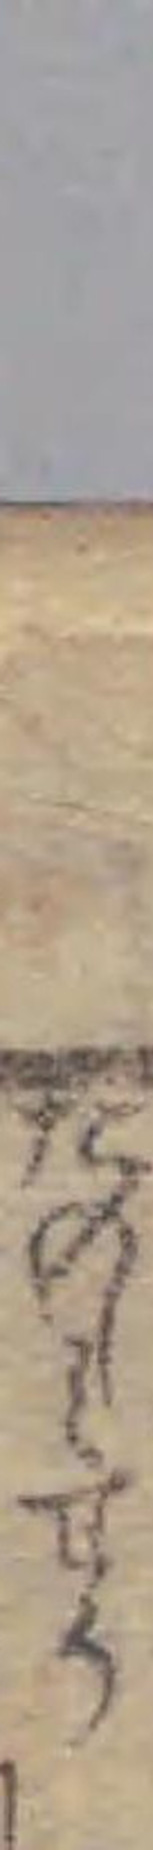たのしみせう
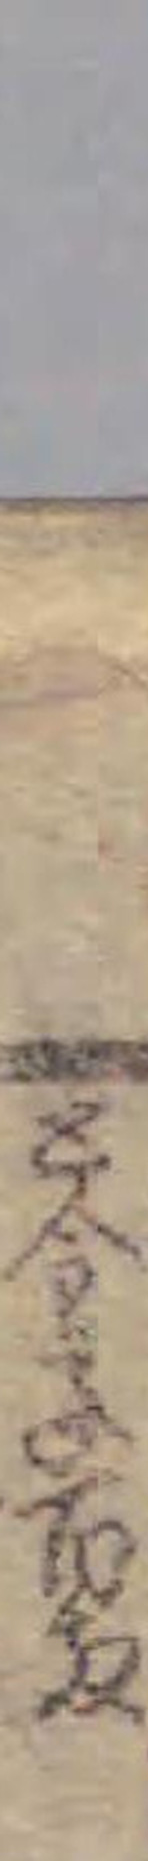と金子百両
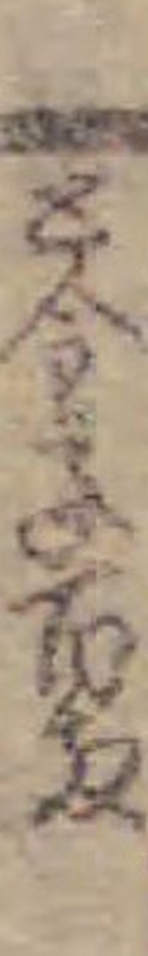と金子百両
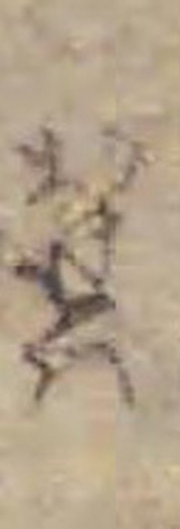おせは
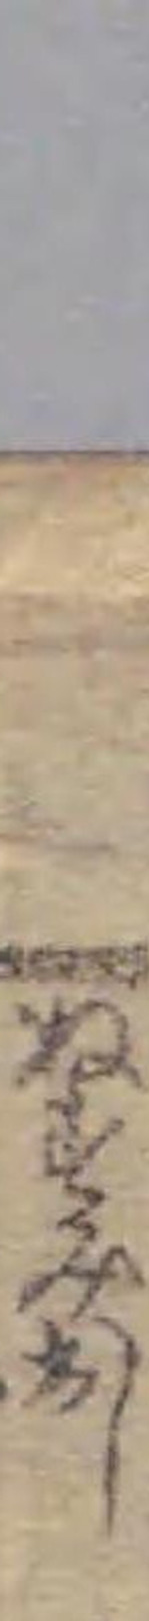ぬすみ出し
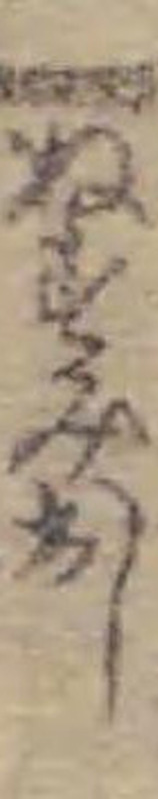ぬすみ出し
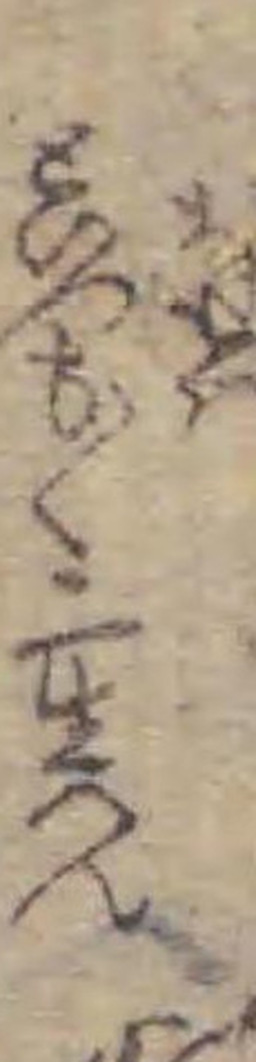どいつも〳〵一生へん
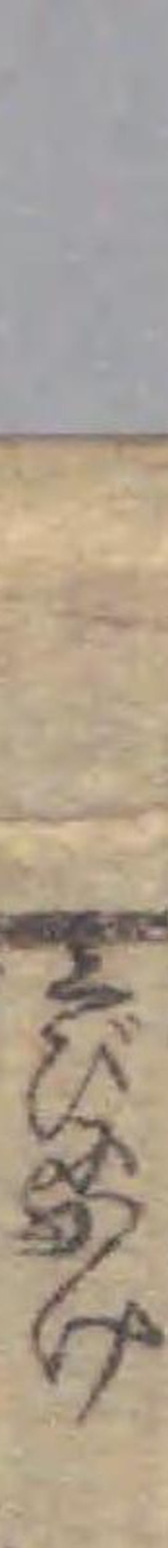くびにかけ
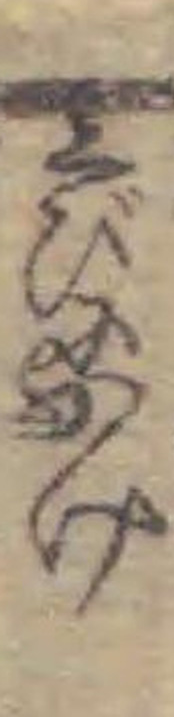くびにかけ
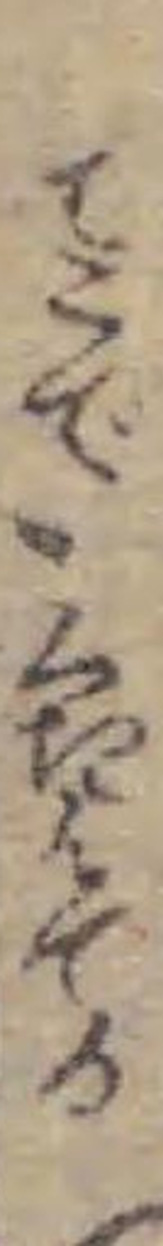てこでくちはてる
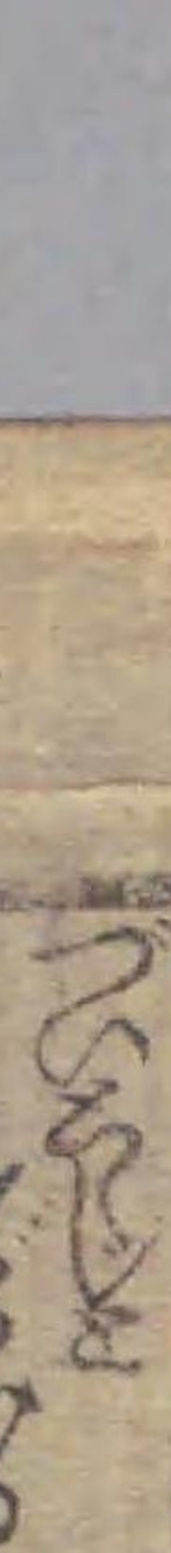づいとくじと
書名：通風伊勢物語 : 3巻
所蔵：国立国会図書館 National Diet Library, JAPAN
